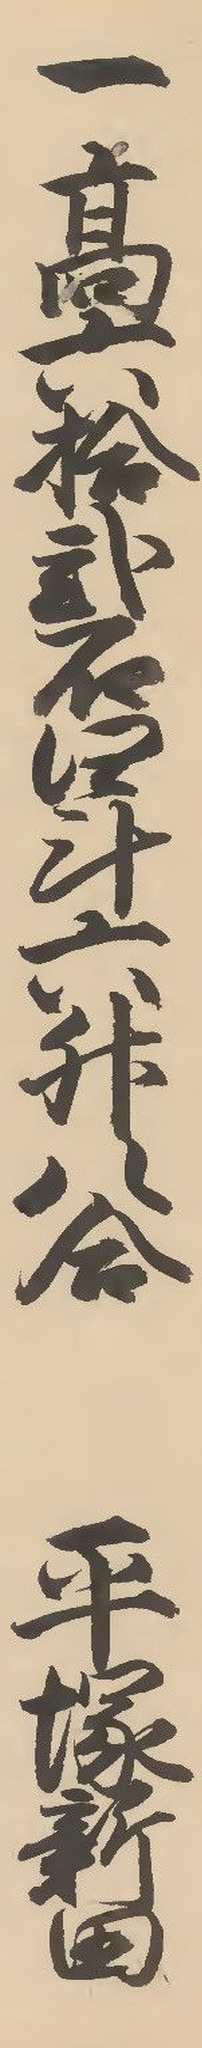一高六拾弐石四斗六升八合平塚新田
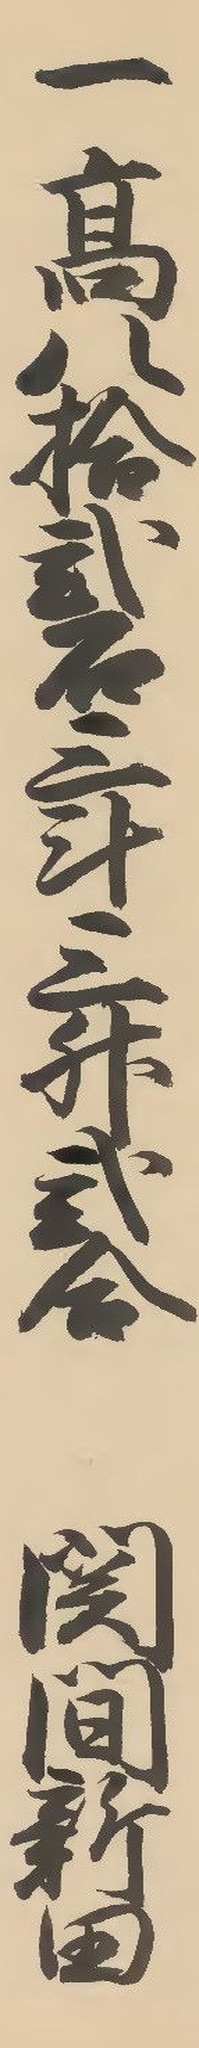一高八拾弐石三斗三升弐合関間新田
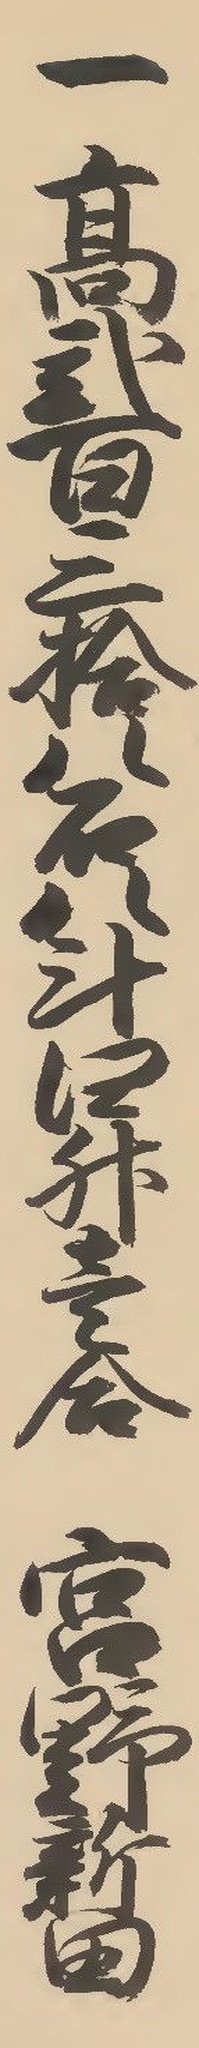一高弐百三拾八石八斗四升壱合宮野新田
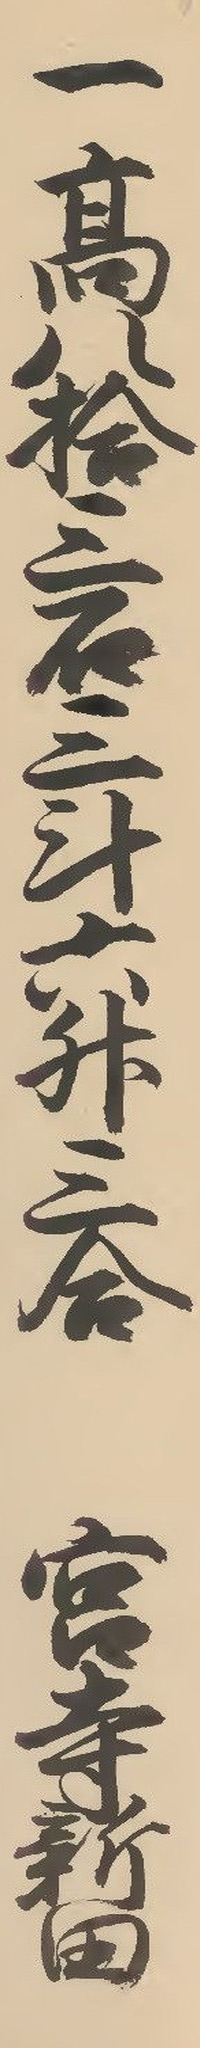一高八拾三石三斗六升三合宮寺新田
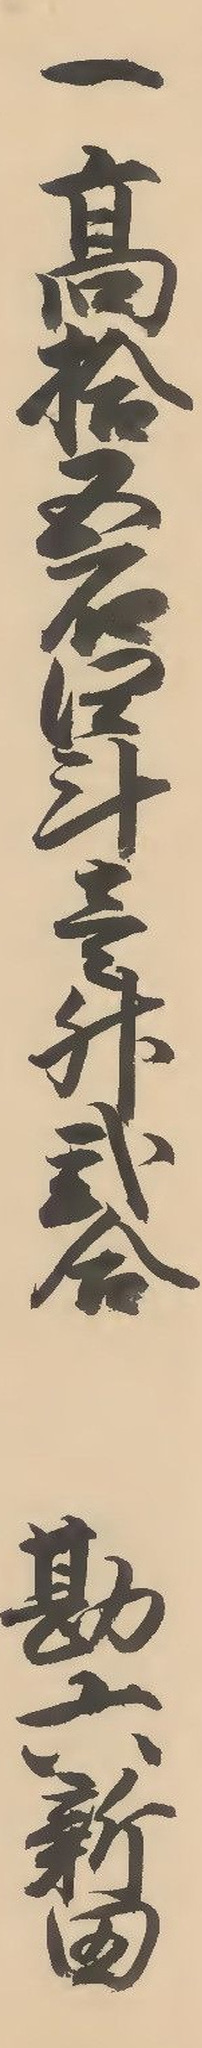一高拾五石四斗壱升弐合勘六新田
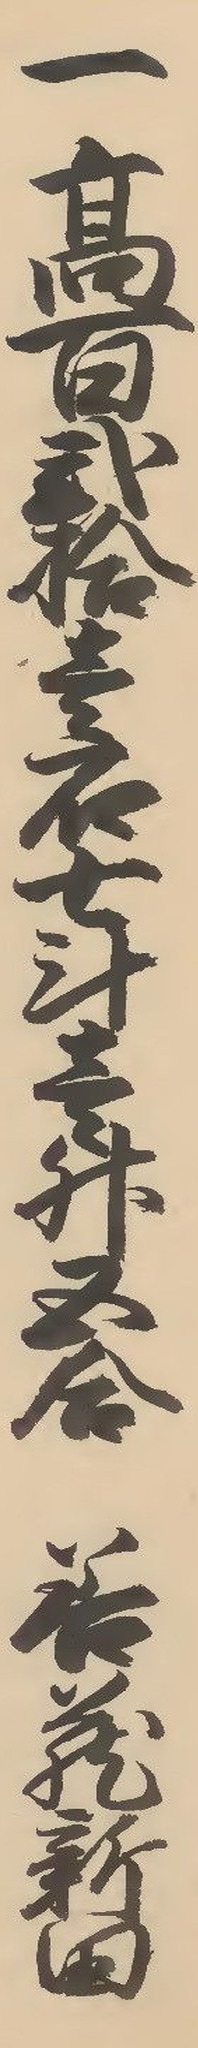一高百弐拾壱石七斗壱升五合善蔵新田
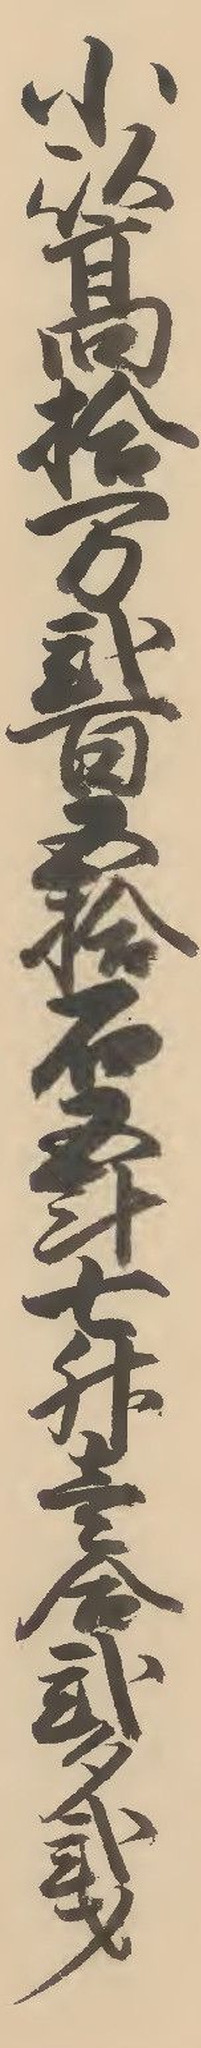小以高拾万弐百五拾五石五斗七升壱合弐勺弐才
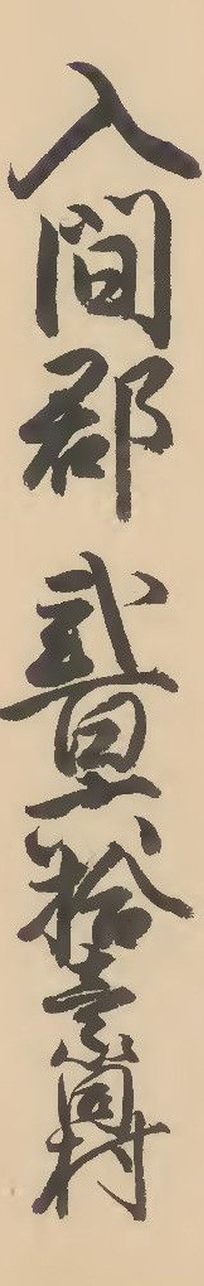入間郡弐百六拾壱箇村

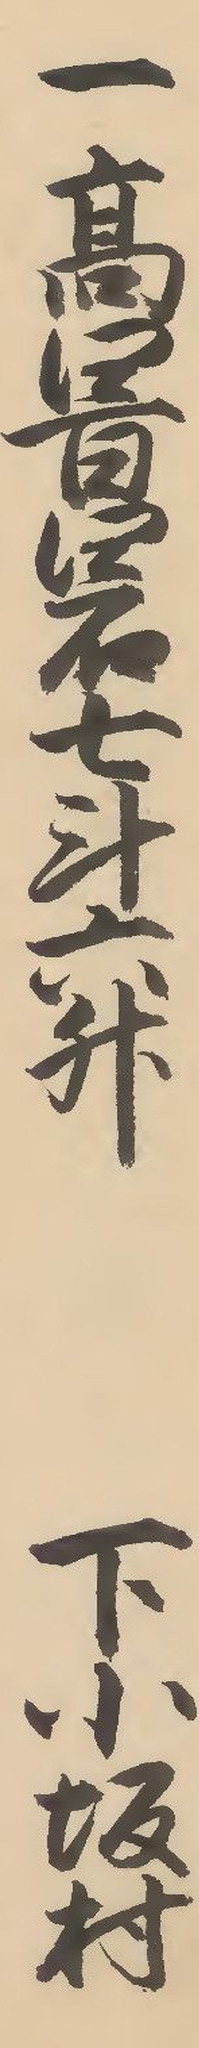一高四百四石七斗六升下小坂村
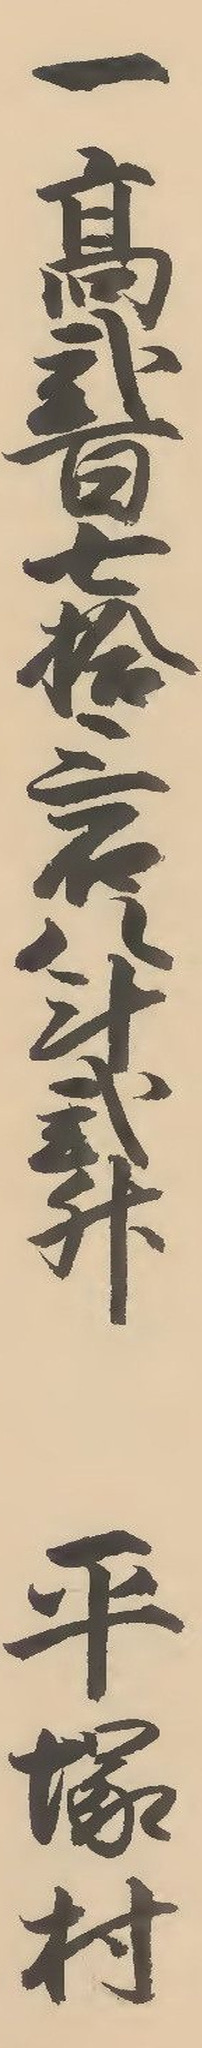一高弐百七拾三石八斗弐升平塚村
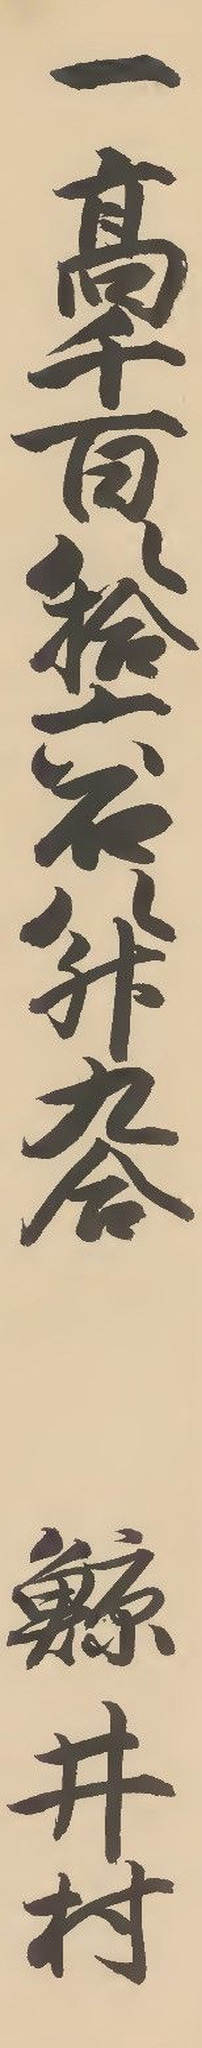一高千百八拾六石八升九合鯨井村
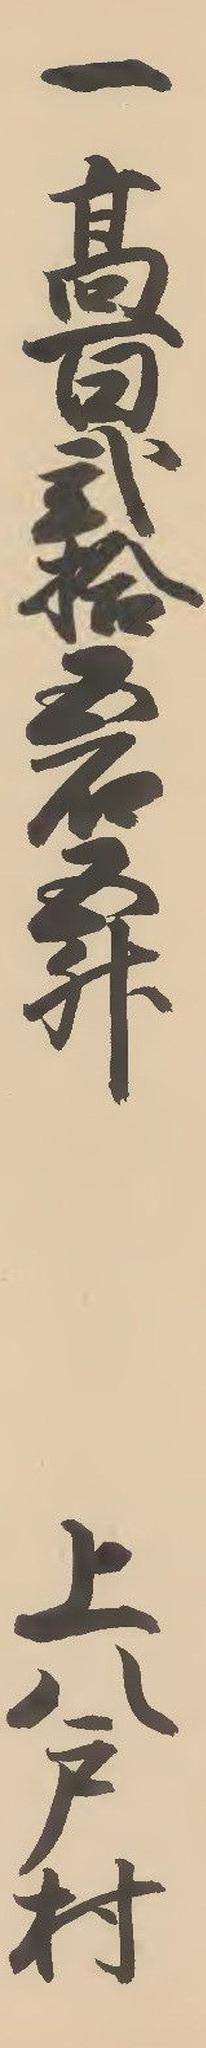一高百弐拾五石五升上八戸村
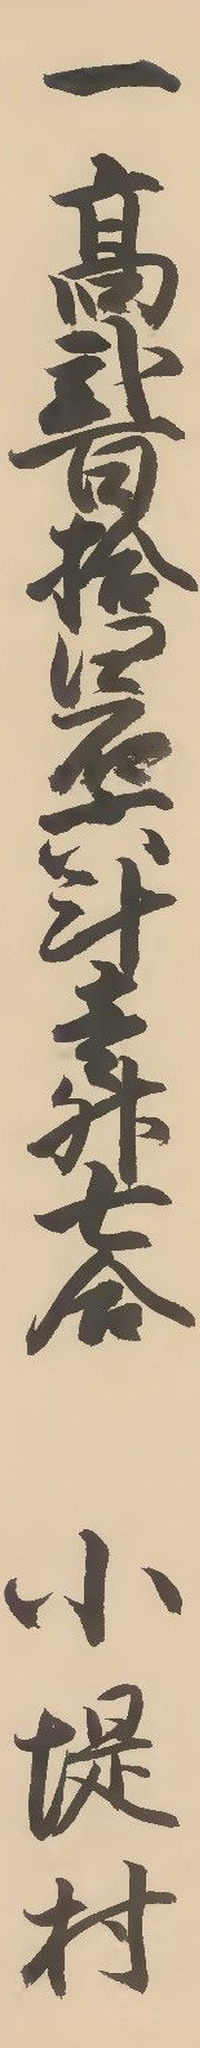一高弐百拾四石六斗壱升七合小堤村
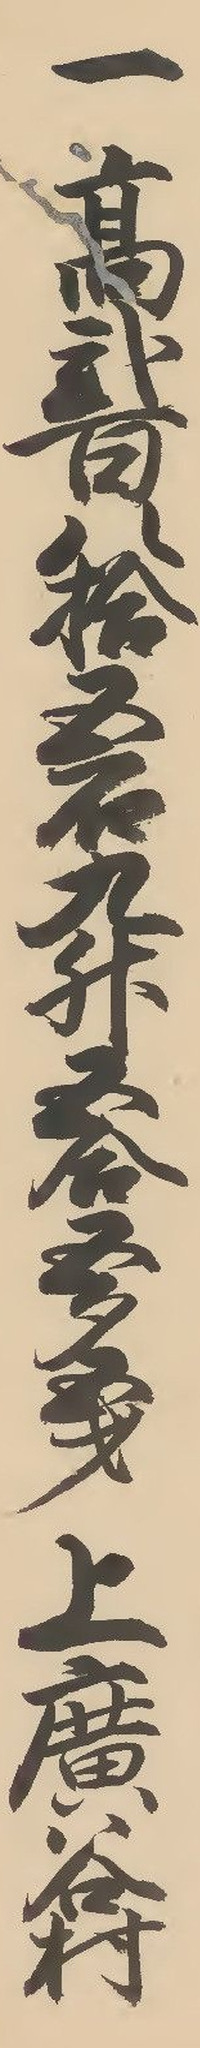一高弐百八拾五石九升五合五勺五才上広谷村

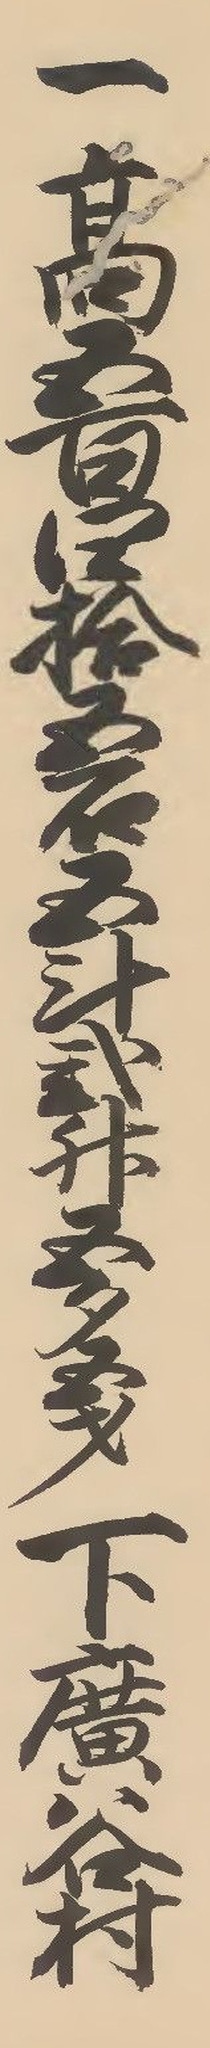一高五百四拾五石五斗弐升五勺五才下広谷村
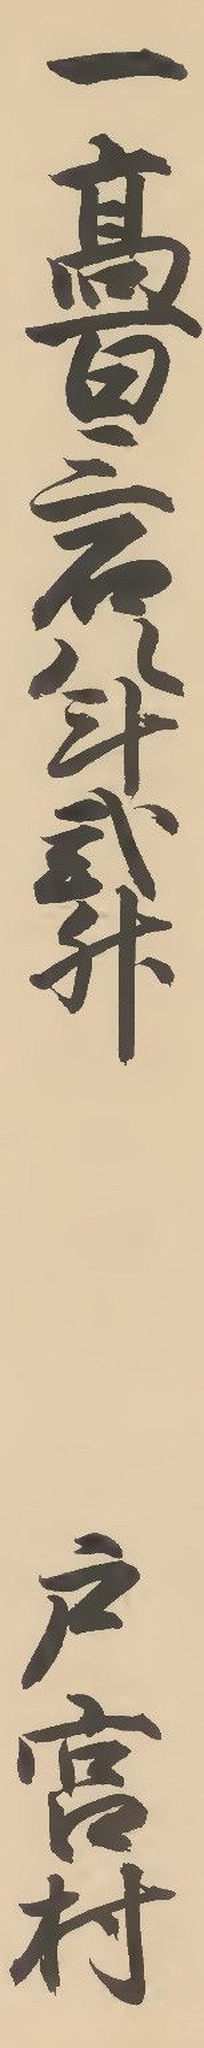一高百三石八斗弐升戸宮村
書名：武蔵国郷帳　上
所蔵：国立公文書館 National Archives of Japan
